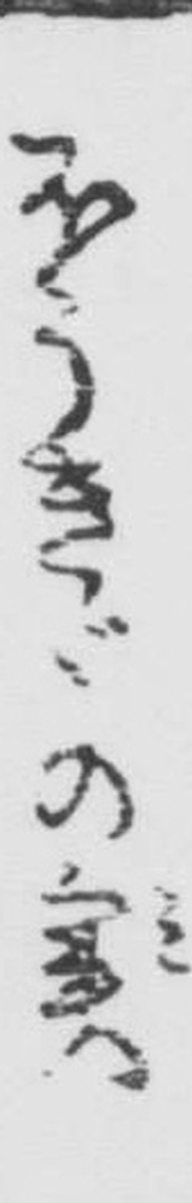ほうきゞの実
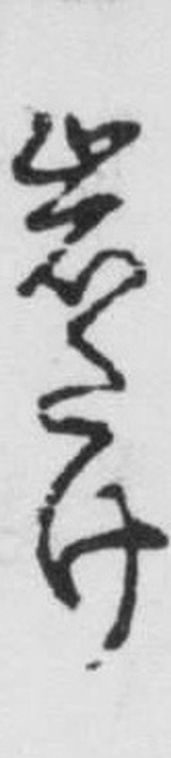岩たけ
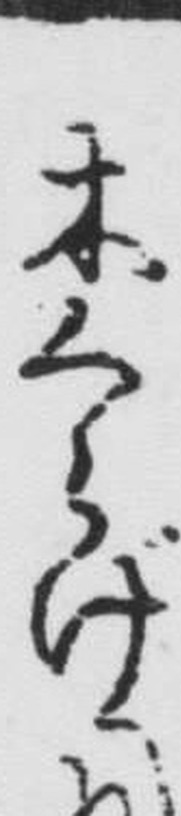木くらげ
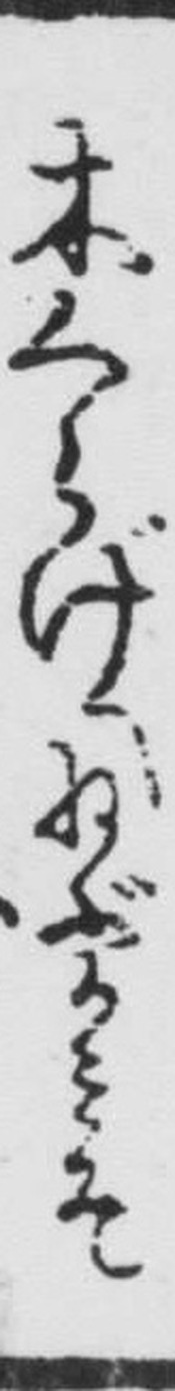木くらげ〽ねぶかみそ
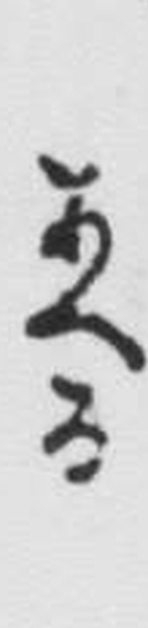あへる
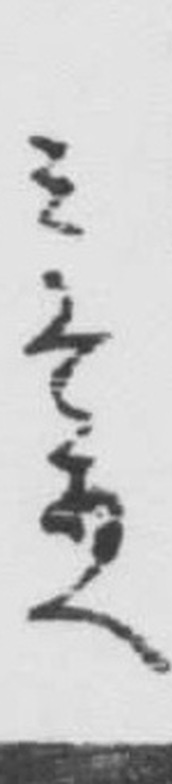みそあへ
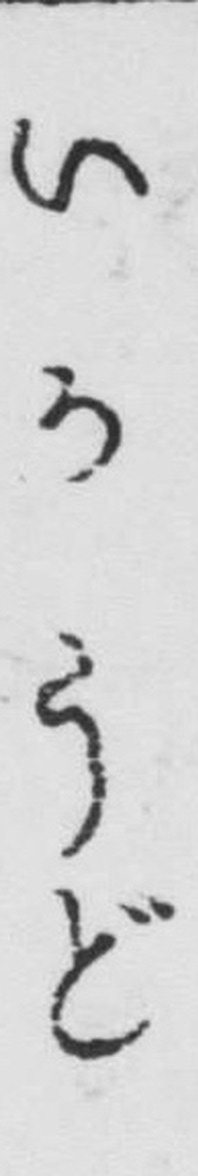いかうど
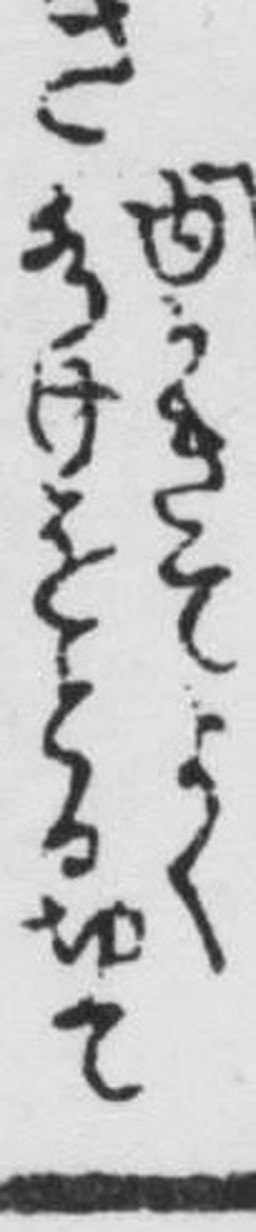水けをとる切て
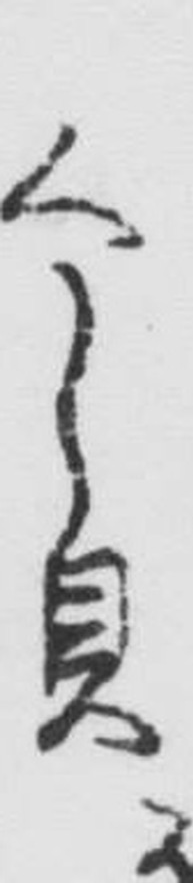くし貝
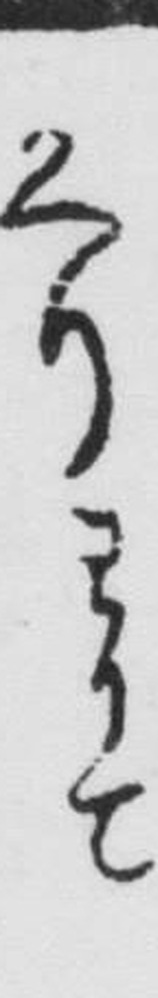くりわりて
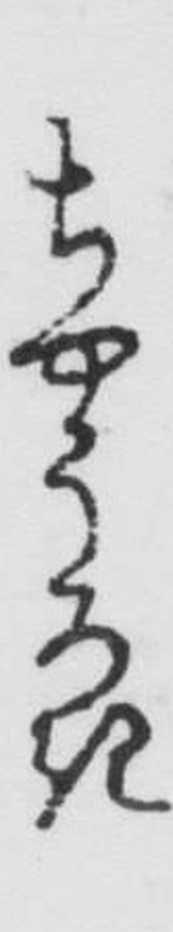ちやうろき
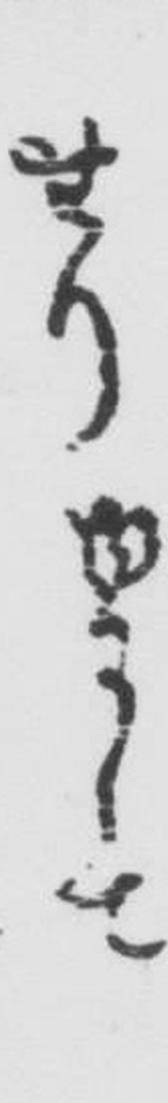せりゆにして
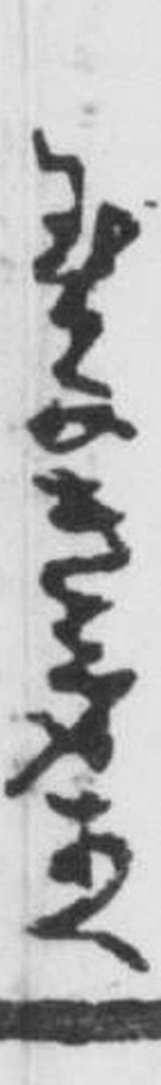玉子き身あへ
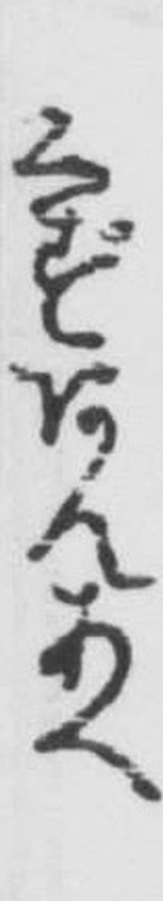くずあんあへ
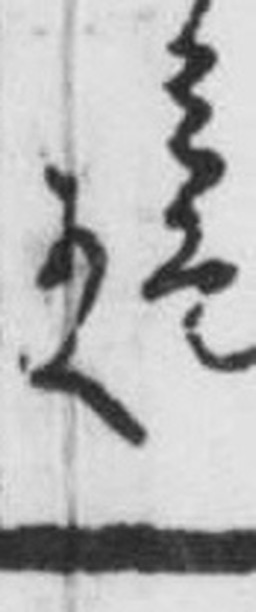あへる
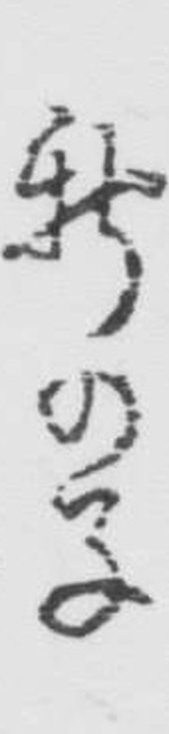新の子
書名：諸家通用/即席料理
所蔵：大阪府立大学学術情報センター 国文学研究資料館
